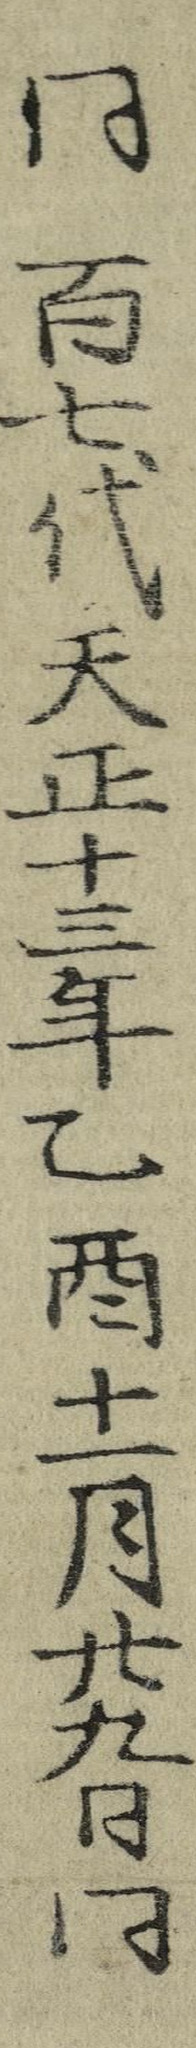同百七代天正十三年乙酉十一月廿九日同
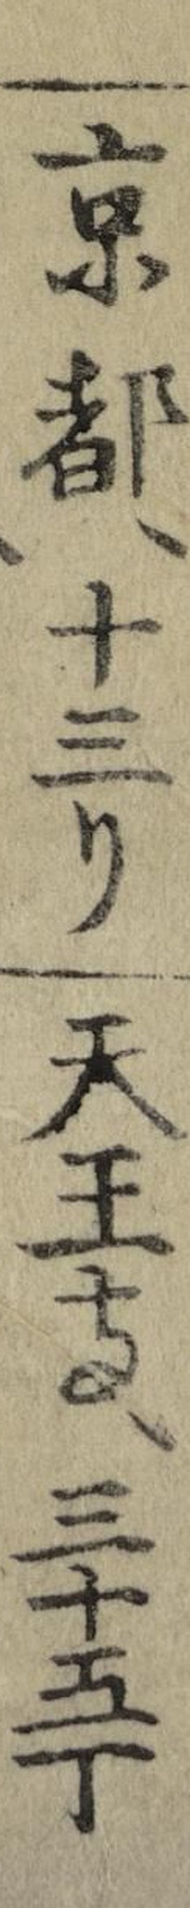京都、十三リ天王寺、三十五丁
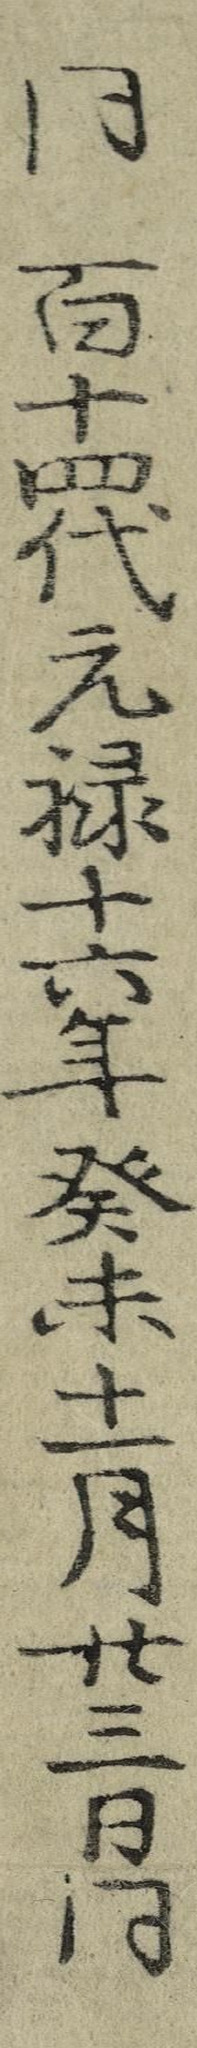同百十四代元禄十六年癸未十一月廿三日同
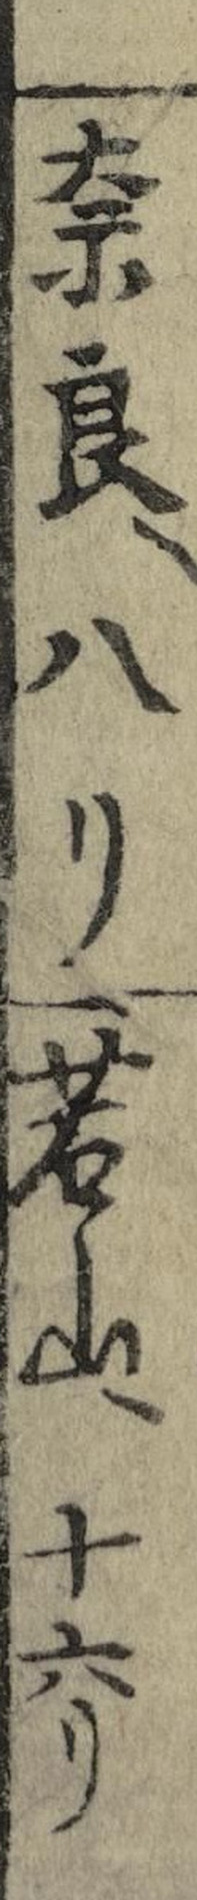奈良、八リ若山、十六リ
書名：摂津大阪近辺早引方角附　大地震ニ附大津波次第
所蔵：東京大学地震研究所図書室 Earthquake Research Institute Library, The University of Tokyo, JAPAN
